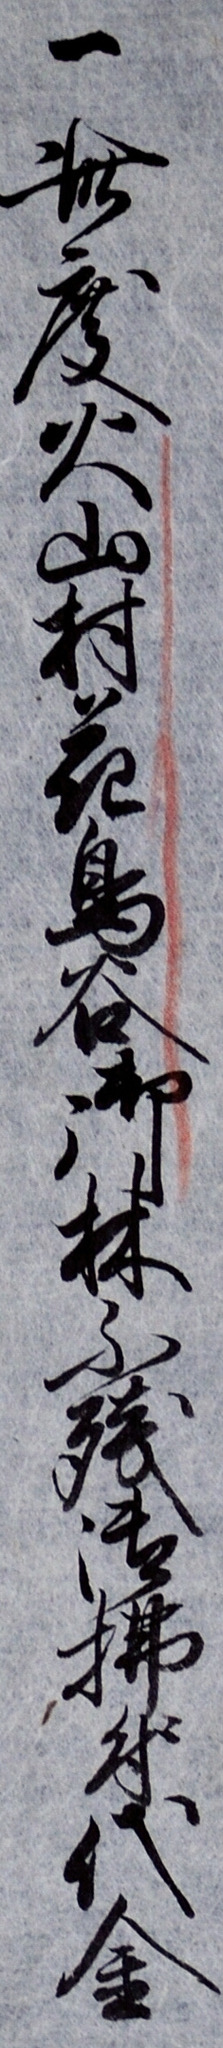一此度火山村花島谷御林不残御払ニ付代金
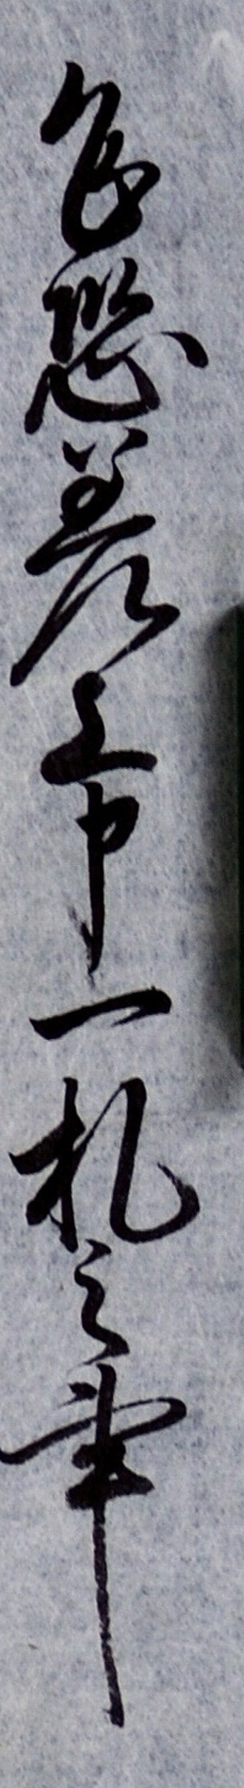乍恐差上申一札之事
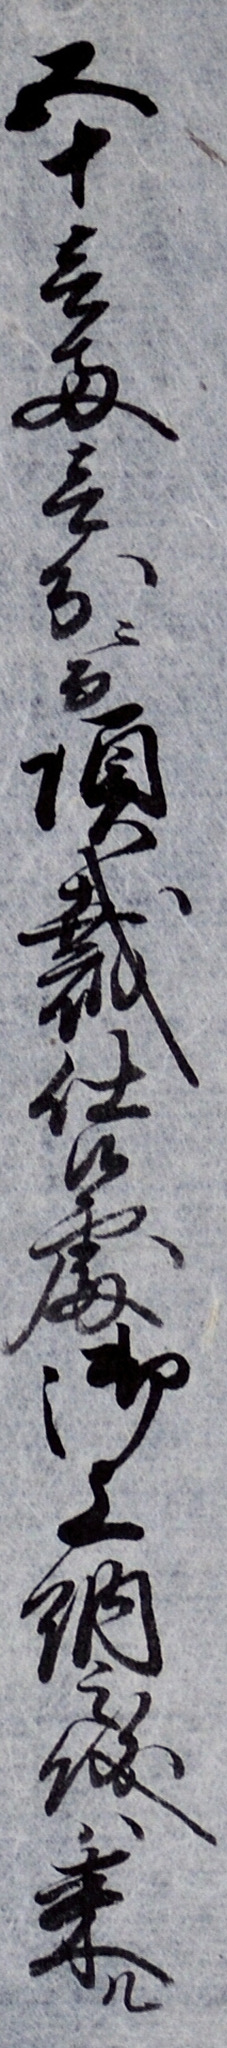五十十壱両壱分ニ而頂戴仕候処御上納之儀ハ来ル
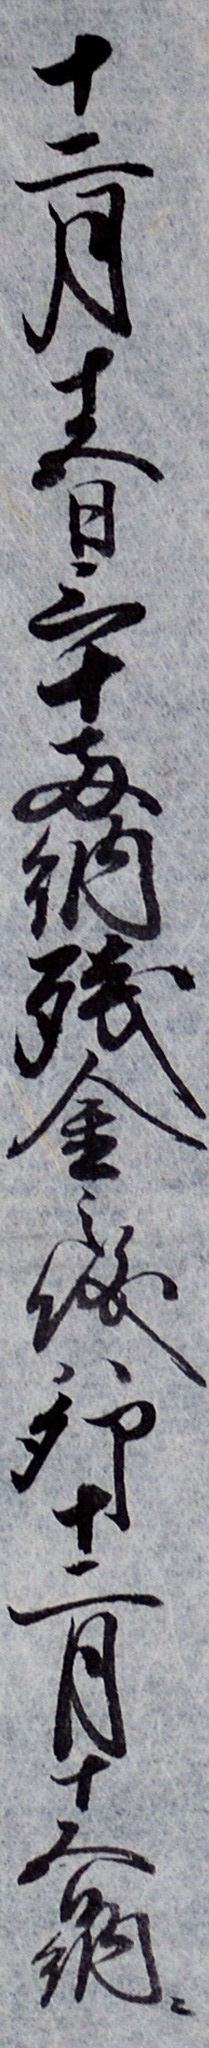十二月十五日三十両納残金之儀ハ卯十二月十五日納ニ
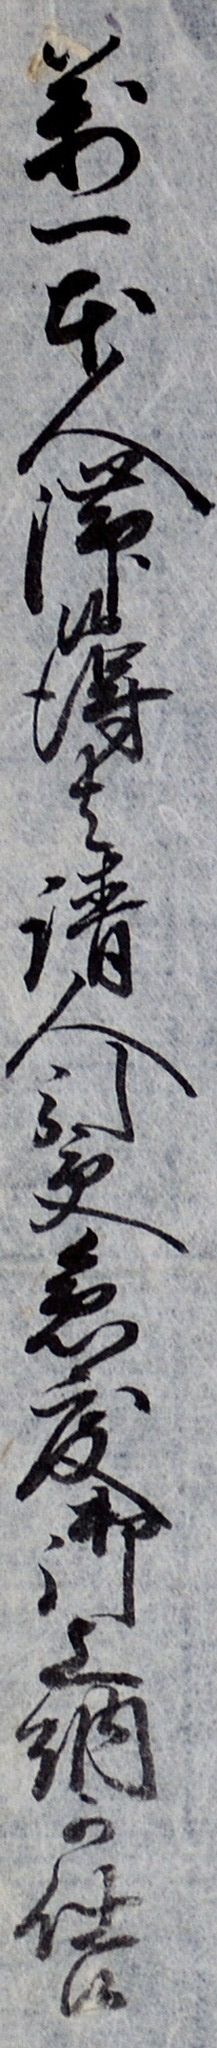万一本人滞候得者請人引受急度御上納可仕候
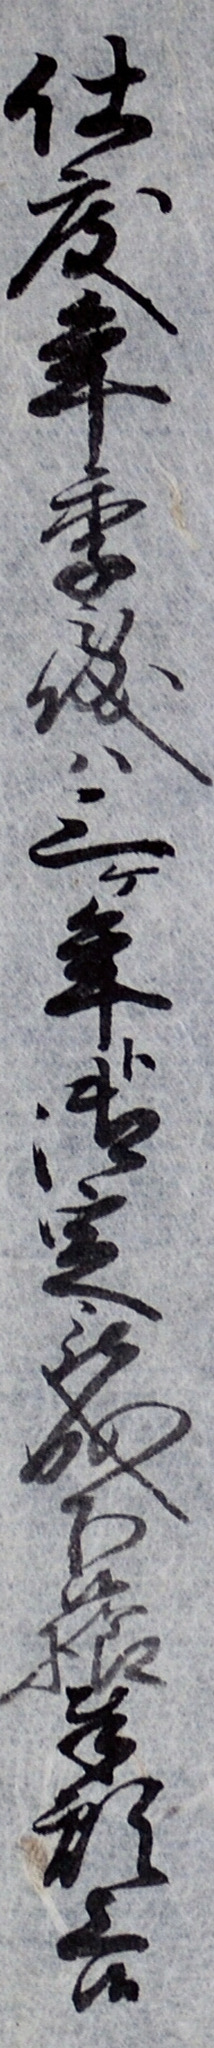仕度年季之儀ハ三ケ年ト御定被成下候様奉願上候
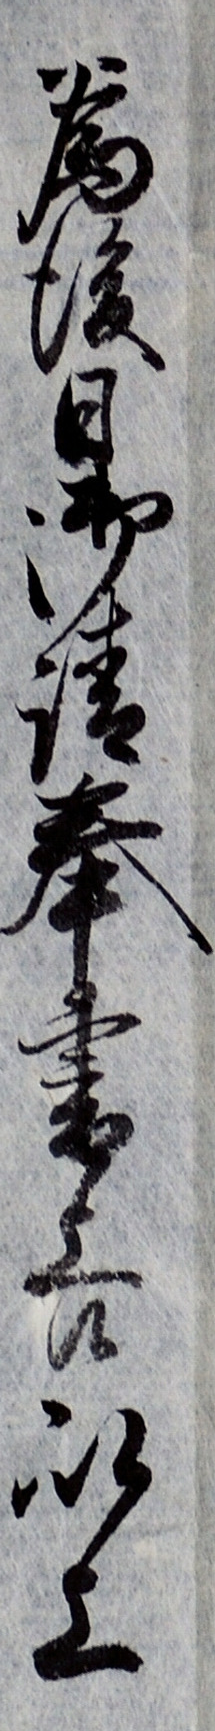為後日御請奉書上候以上
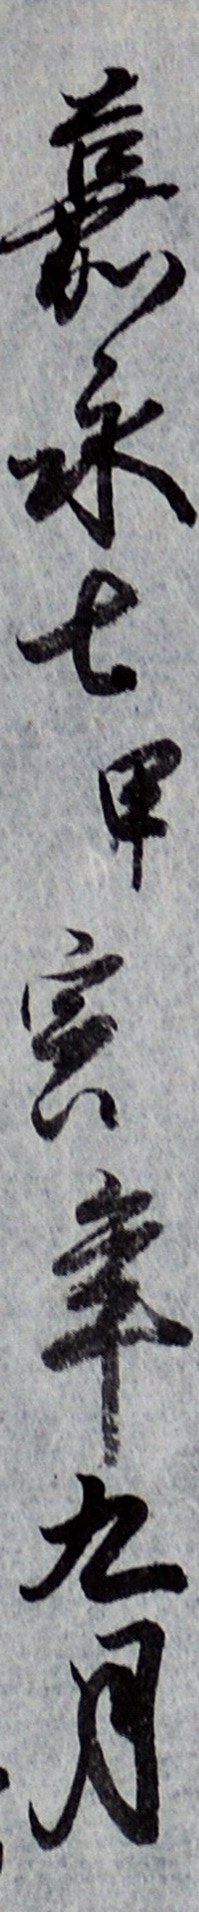嘉永七甲寅年九月
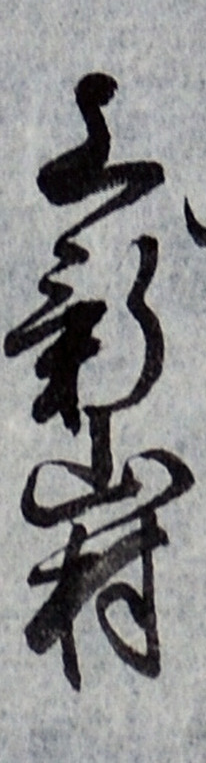上新山村
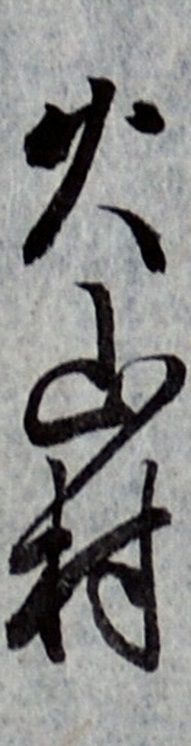火山村
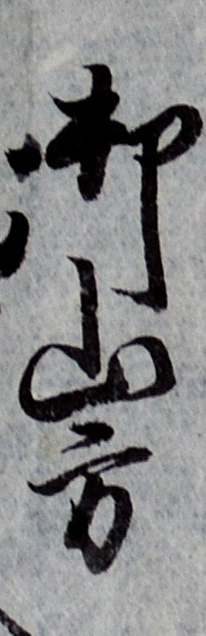御山方
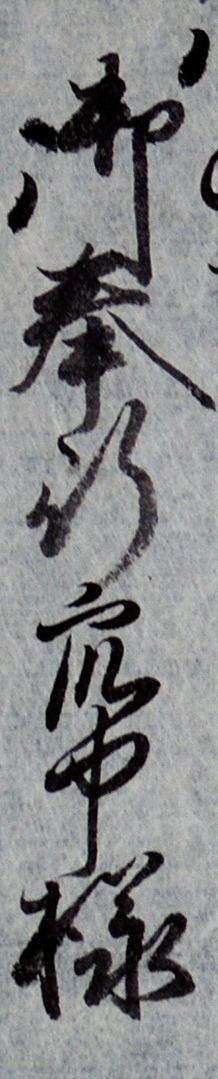御奉行衆中様
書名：乍恐差上申一札之事
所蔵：伊那市立高遠町図書館・合同会社AMANE
